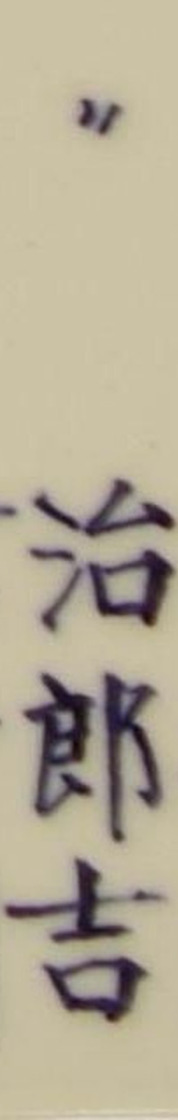治郎吉
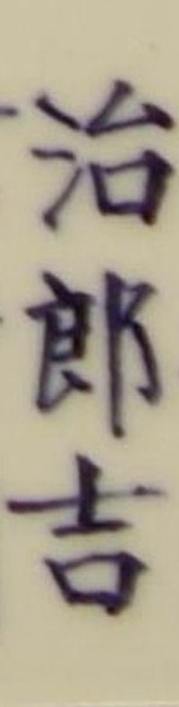治郎吉
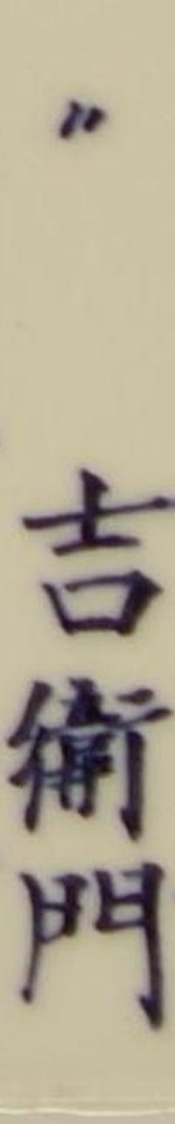吉衛門
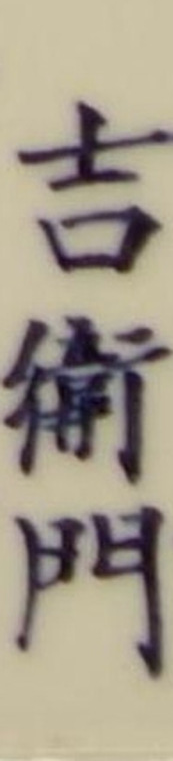吉衛門
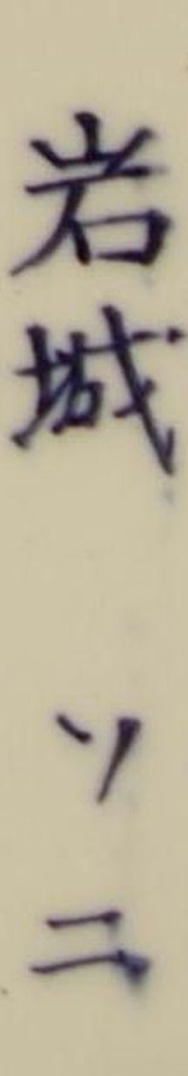岩城ソ二
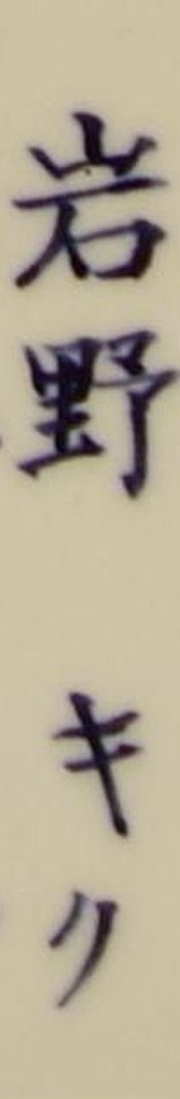岩野キク
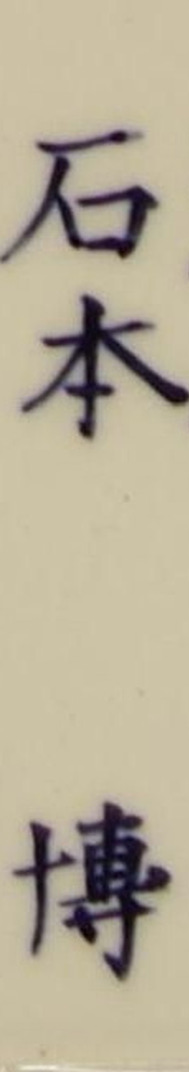石本博
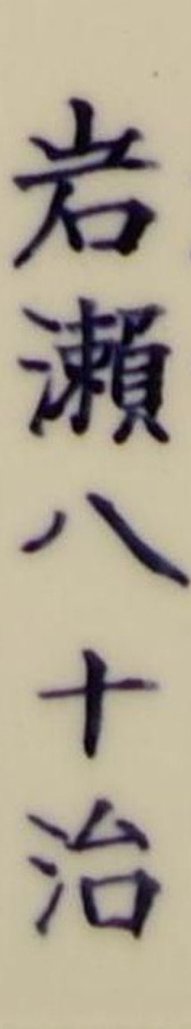岩瀬八十治
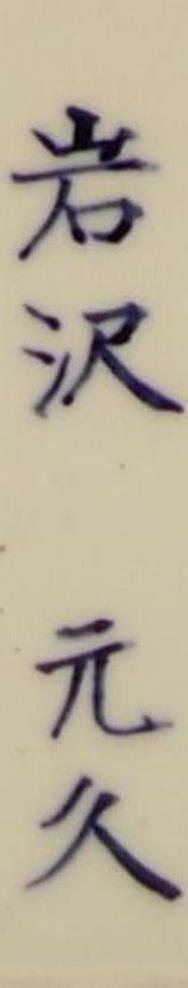岩沢元久
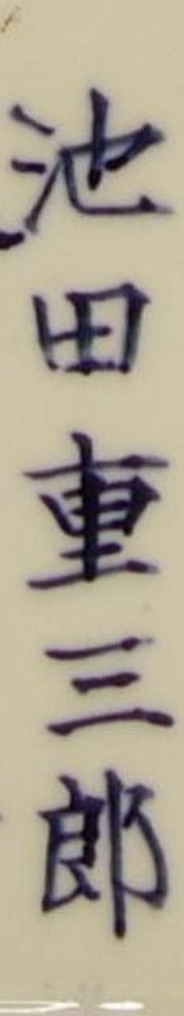池田重三郎
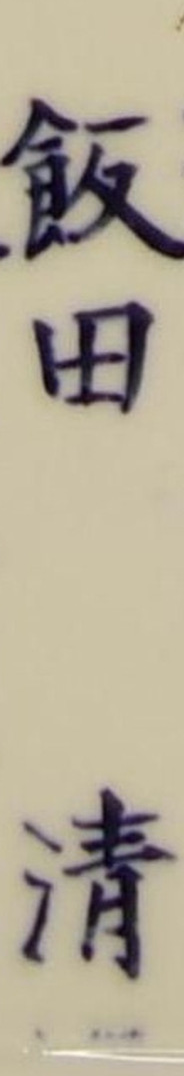飯田清
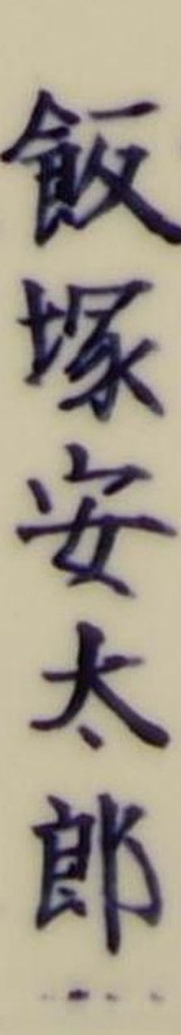飯塚安太郎
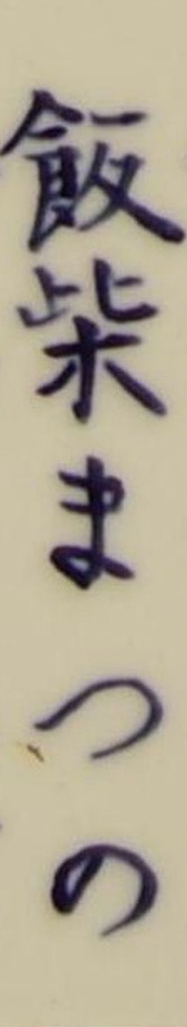飯柴まつの
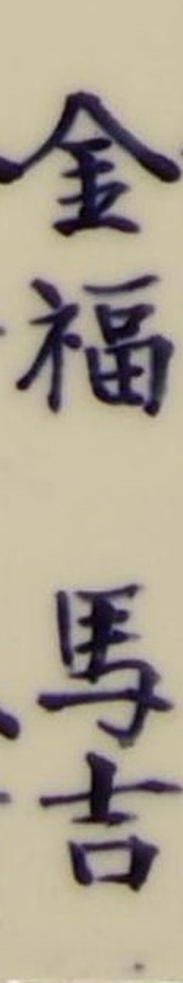金福馬吉
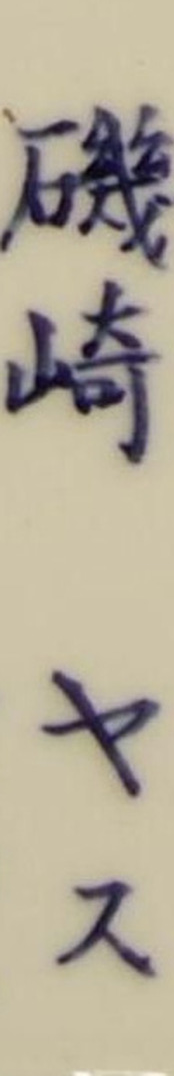磯崎ヤス
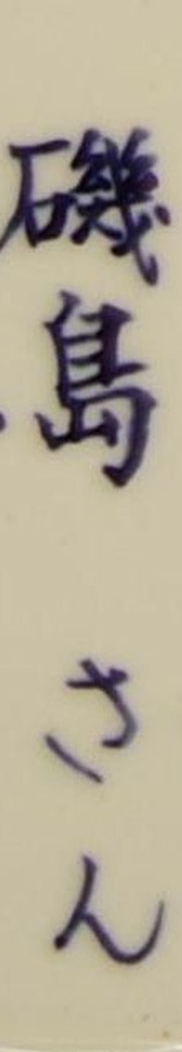磯島さん
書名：E~L
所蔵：高野山金剛峯寺
